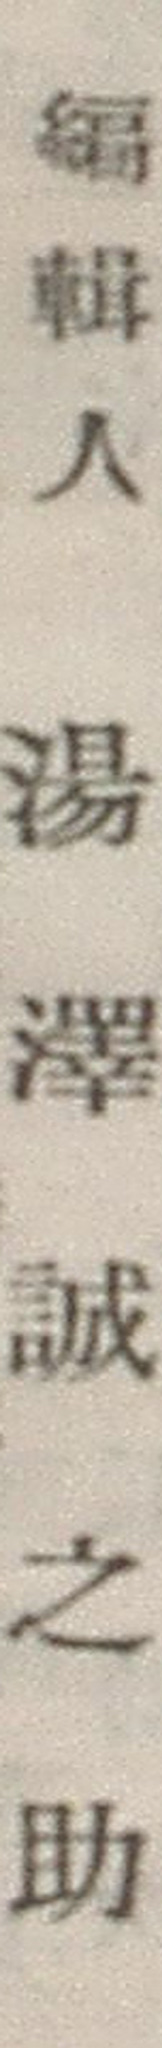編輯人湯澤誠之助
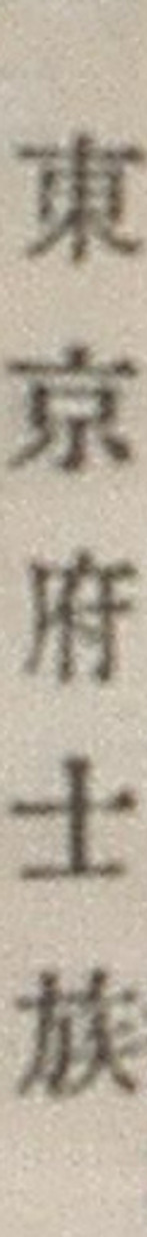東京府士族
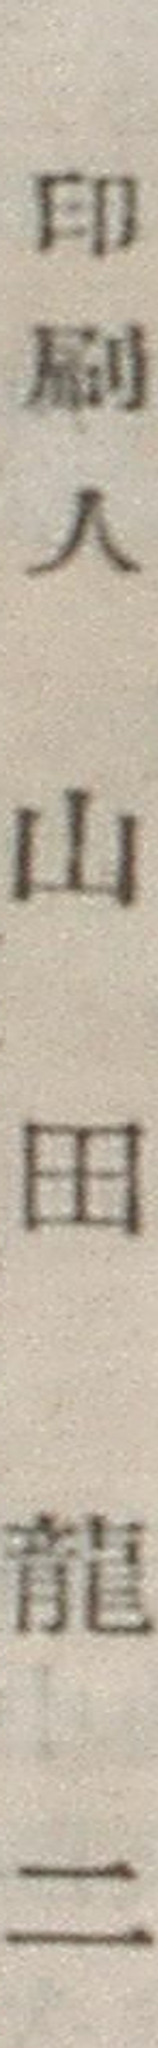印刷人山田龍二
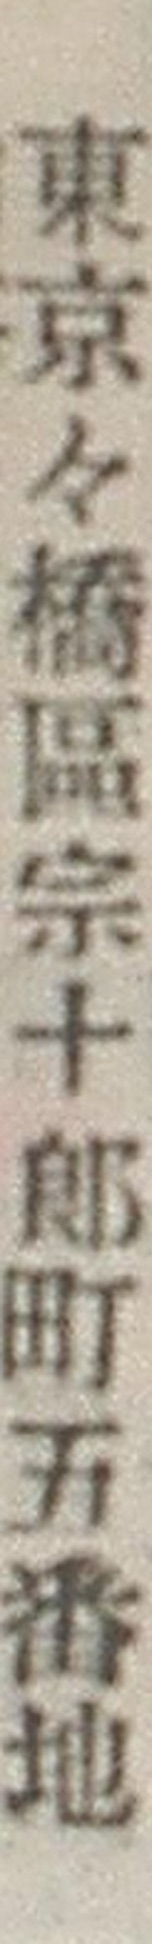東京々橋区宗十郎町五番地
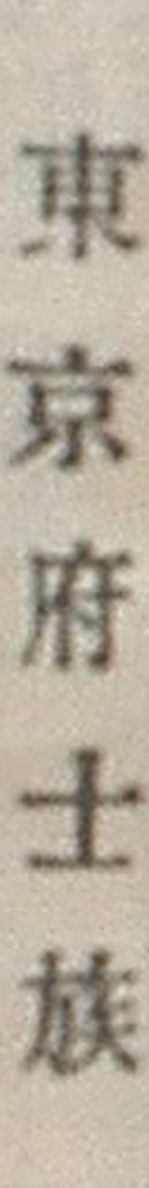東京府士族
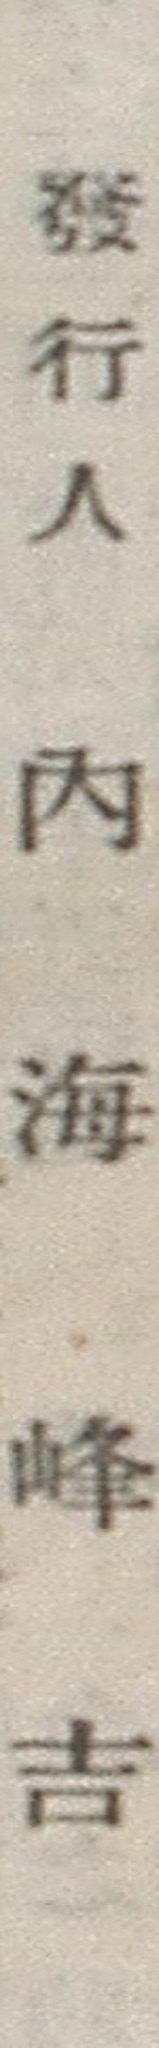発行人内海峰吉
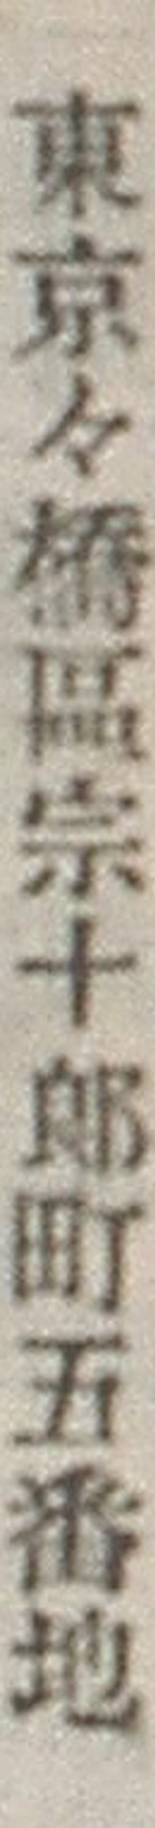東京々橋区宗十郎町五番地
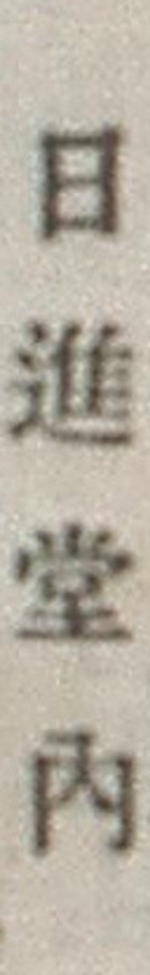日進堂内
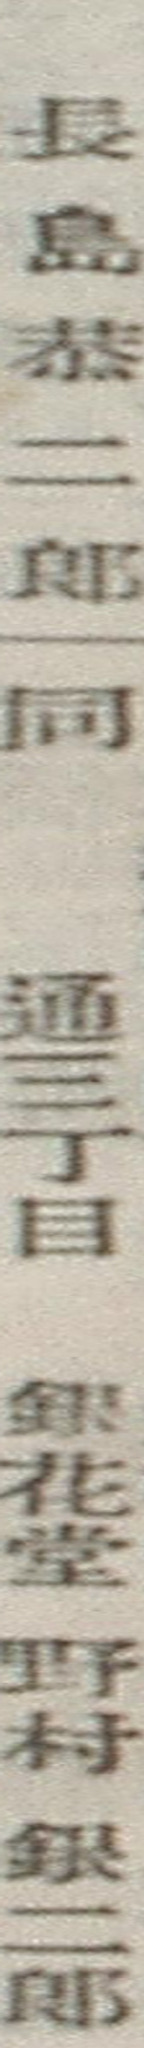同同長島恭二郎同通三丁目銀花堂野村銀二郎

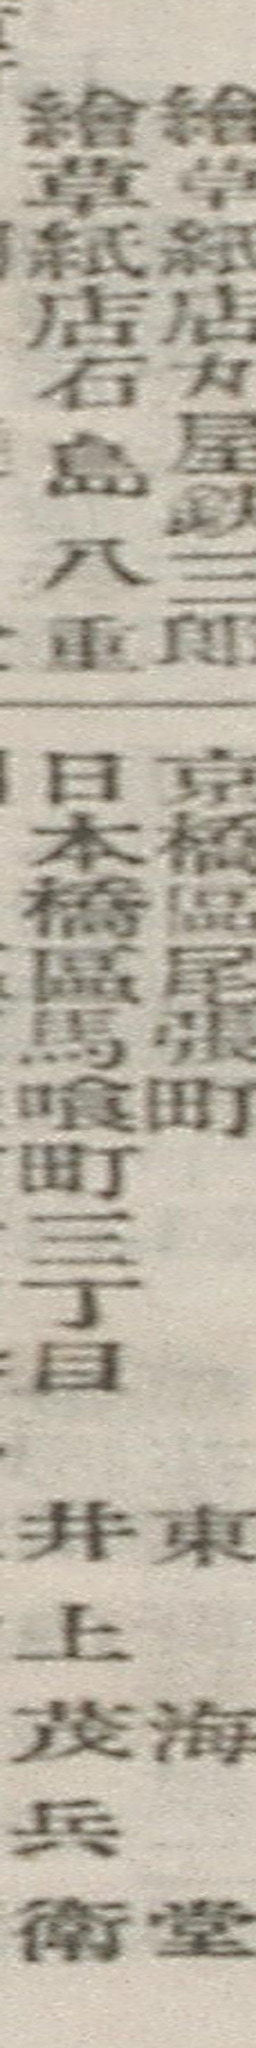同通三丁目絵草紙店石島八重日本橋区馬喰町三丁目井上茂兵衛
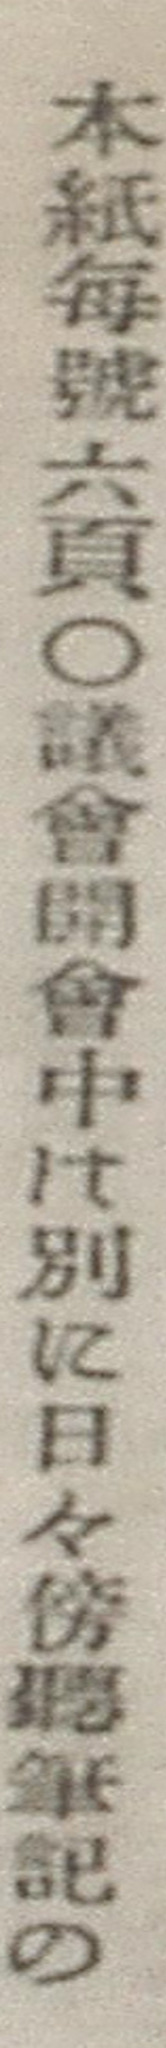〇〇本紙毎号六頁〇議会開会中は別に日々傍聴筆記の
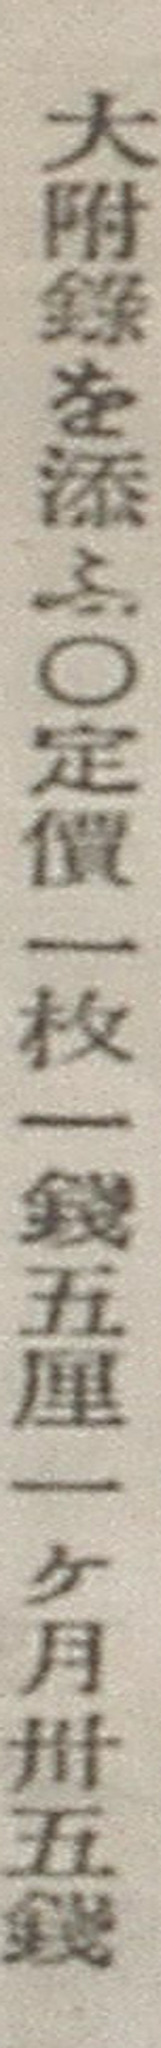〇〇大附録を添ふ〇定価一枚一銭五厘一ケ月卅五銭
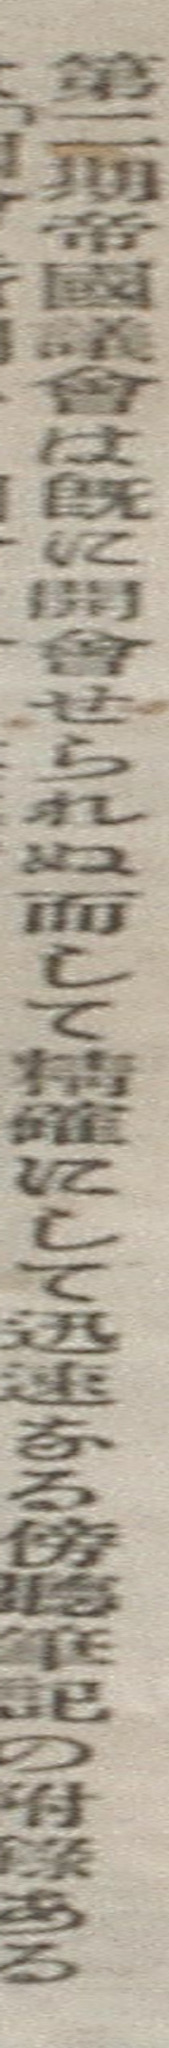第二期帝国議会は既に開会せられぬ而して精確にして迅速なる傍聴筆記の附録ある
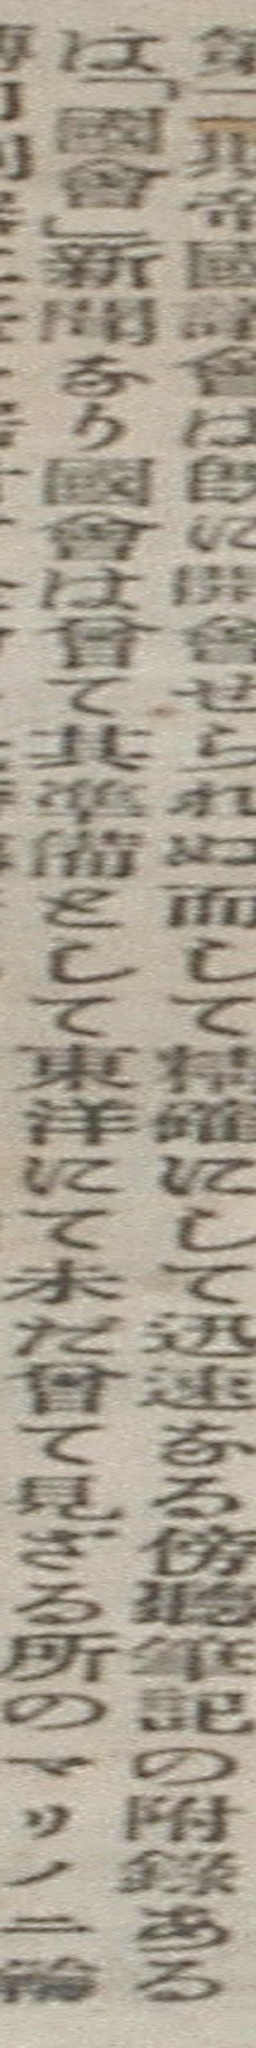は「国会」新聞なり国会は曾て其準備として東洋にて未だ曾て見ざる所のマリノニ輪
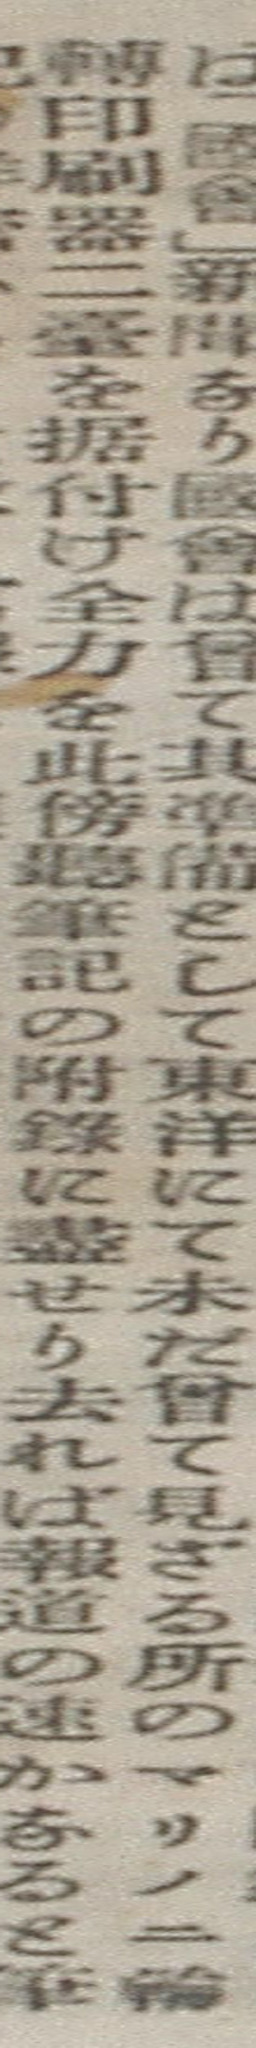転印刷器二台を据付け全力を此傍聴筆記の附録に尽せり去れば報道の速かなると筆
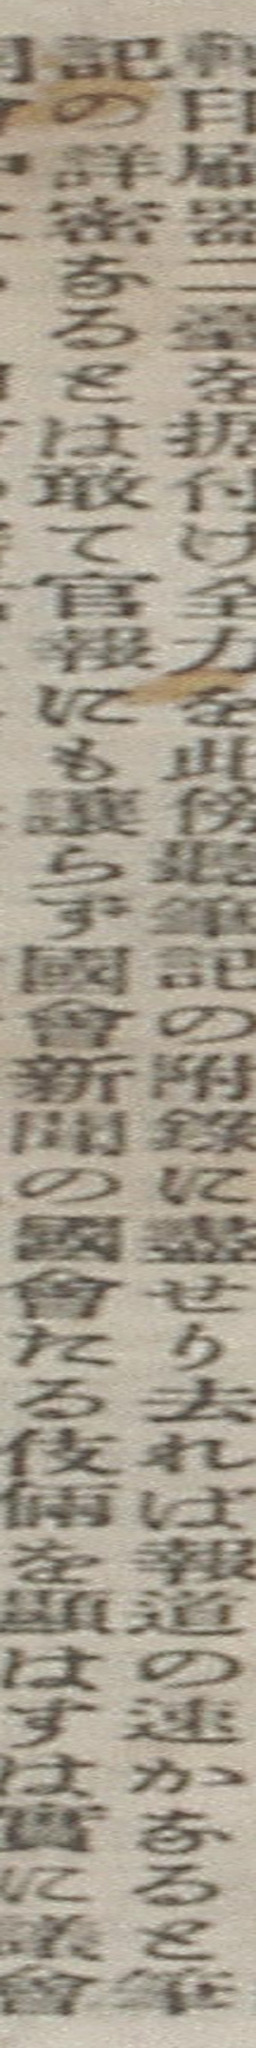記の詳密なるとは敢て官報にも譲らず国会新聞の国会たる伎倆を顕はすは実に議会
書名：愛知岐阜福井三県　大地震見聞録（内題）
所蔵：東京大学地震研究所図書室 Earthquake Research Institute Library, The University of Tokyo, JAPAN
